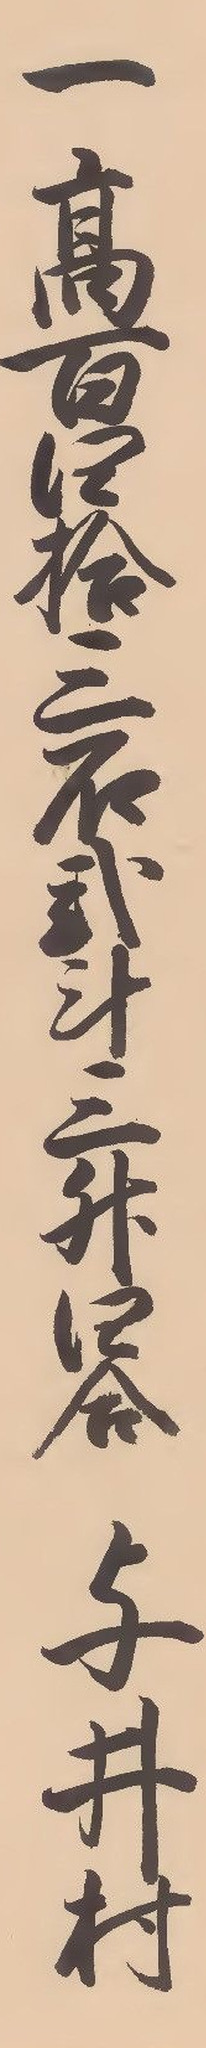一高百四拾三石弐斗三升四合与井村
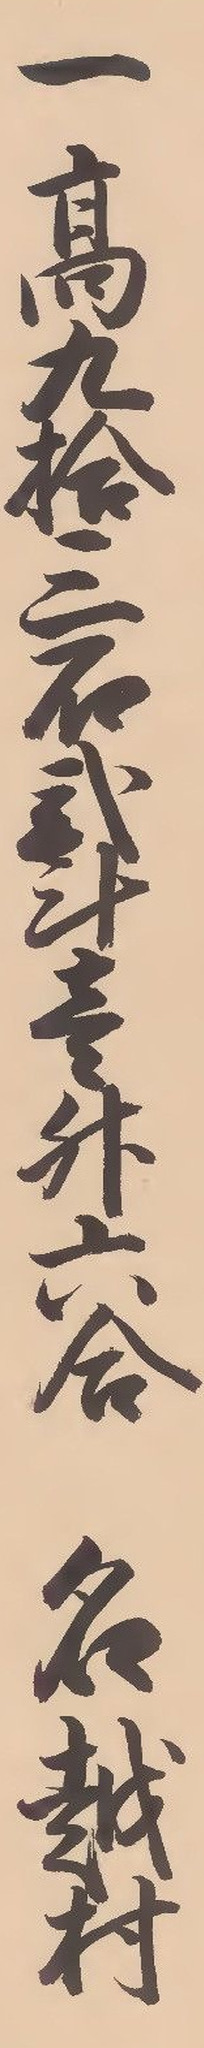一高九拾三石弐斗壱升六合名越村
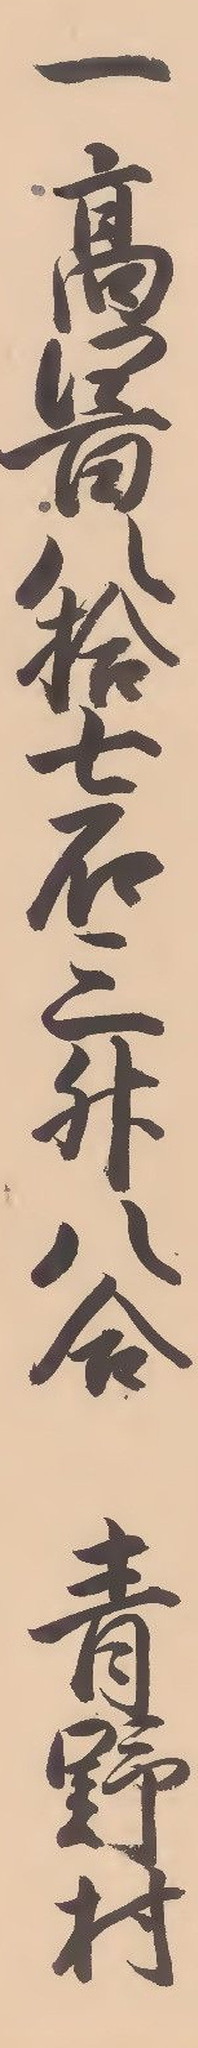一高四百八拾七石三升八合青野村

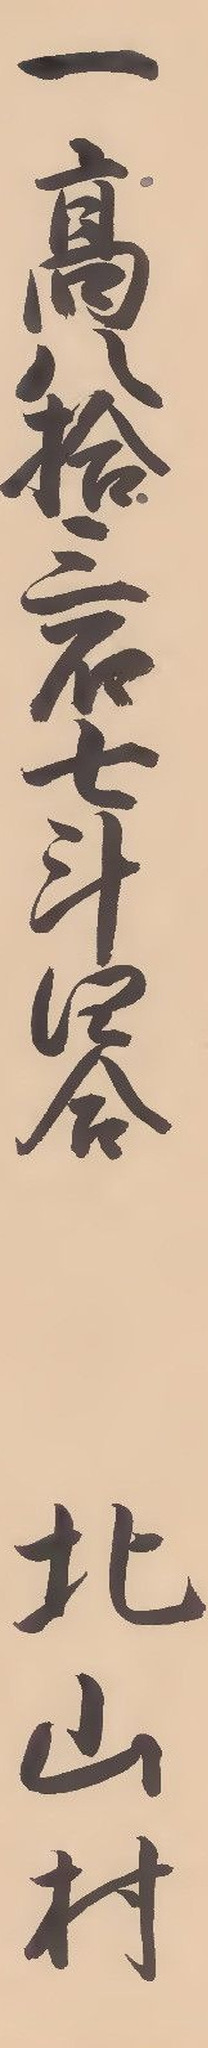一高八拾三石七斗四合北山村
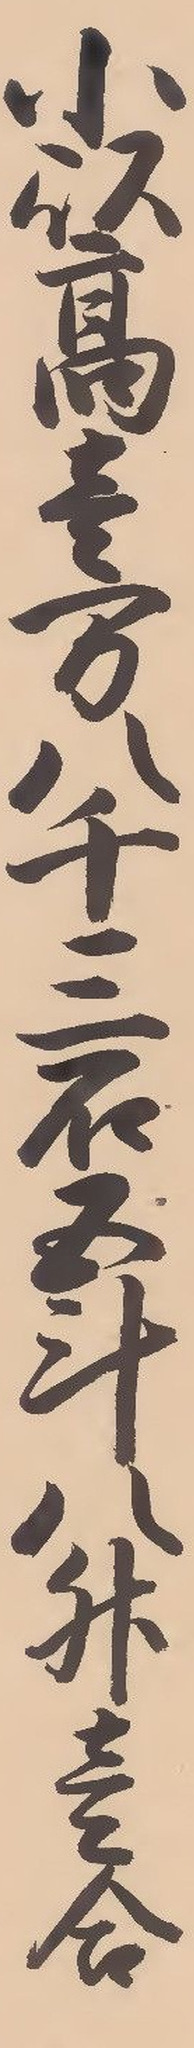小以高壱万八千三石五斗八升壱合
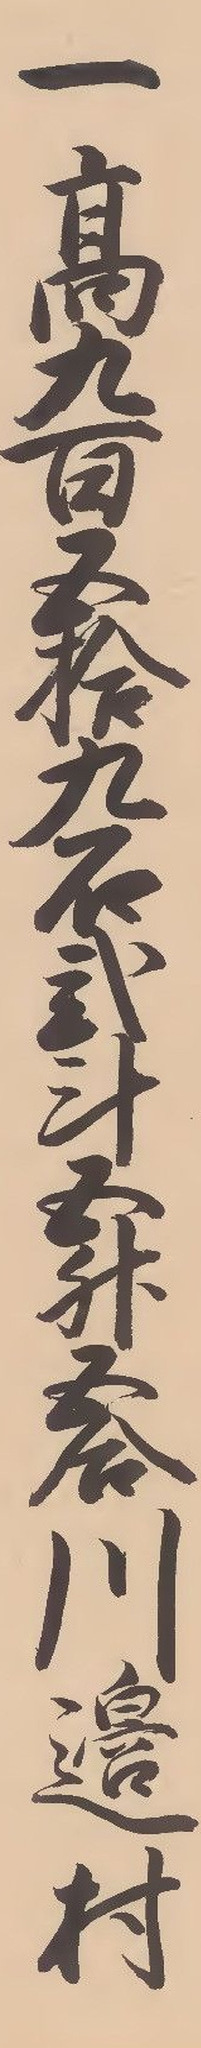一高九百五拾九石弐斗五升五合川辺村
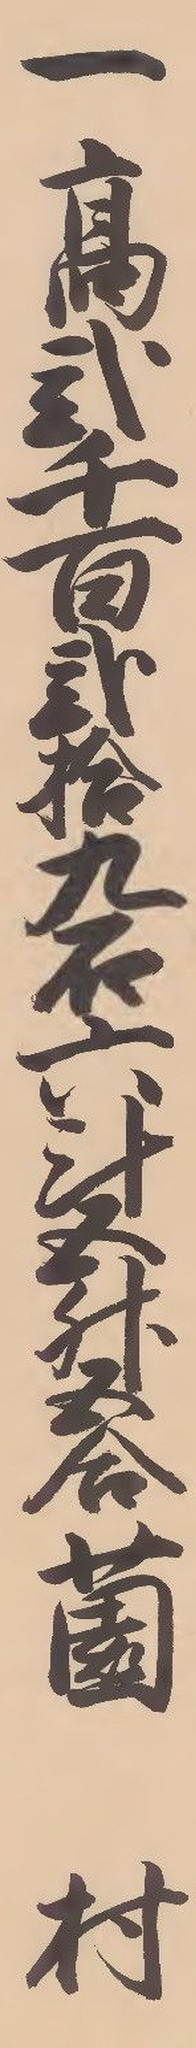一高弐千百弐拾九石六斗五升五合園村
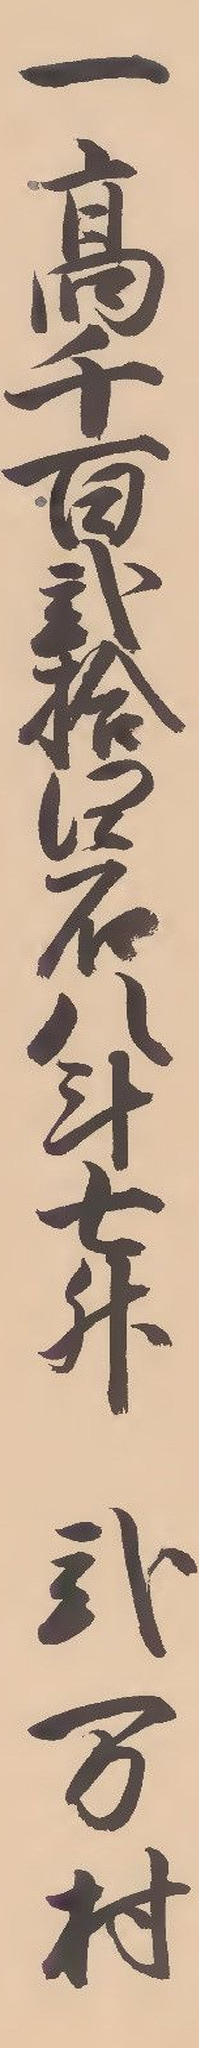一高千百弐拾四石八斗七升弐万村

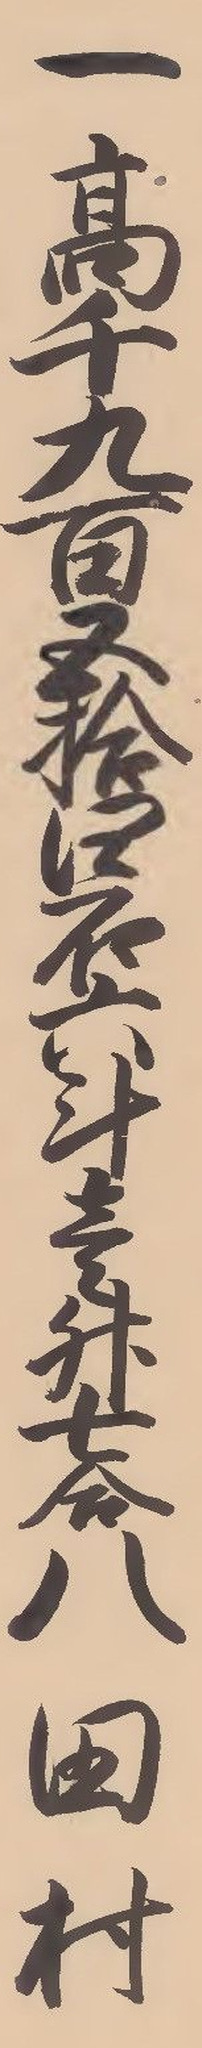一高千九百五拾四石六斗壱升七合八田村
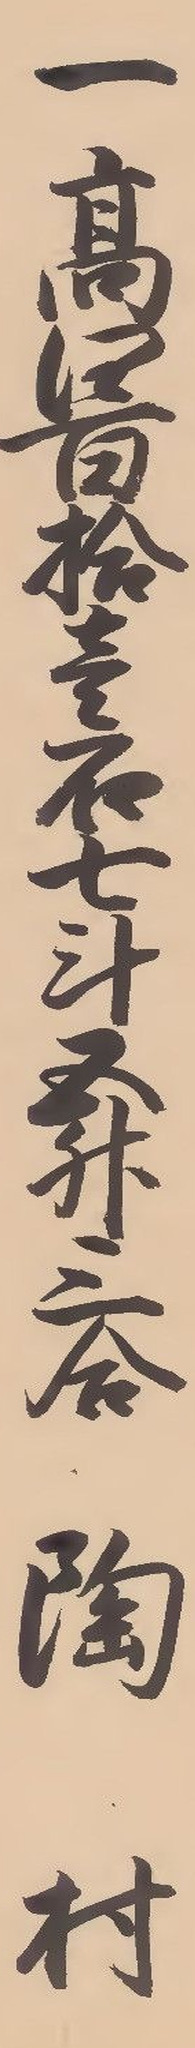一高四百拾壱石七斗五升三合陶村
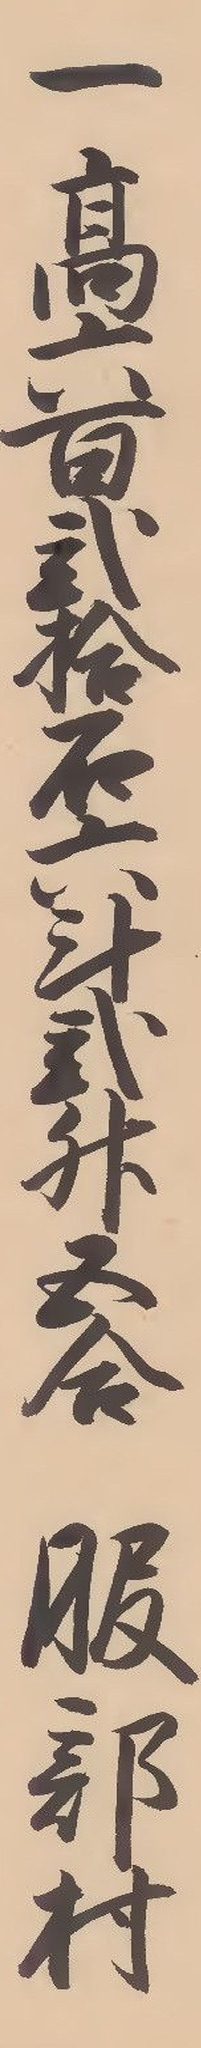一高六百弐拾石六斗弐升五合服部村
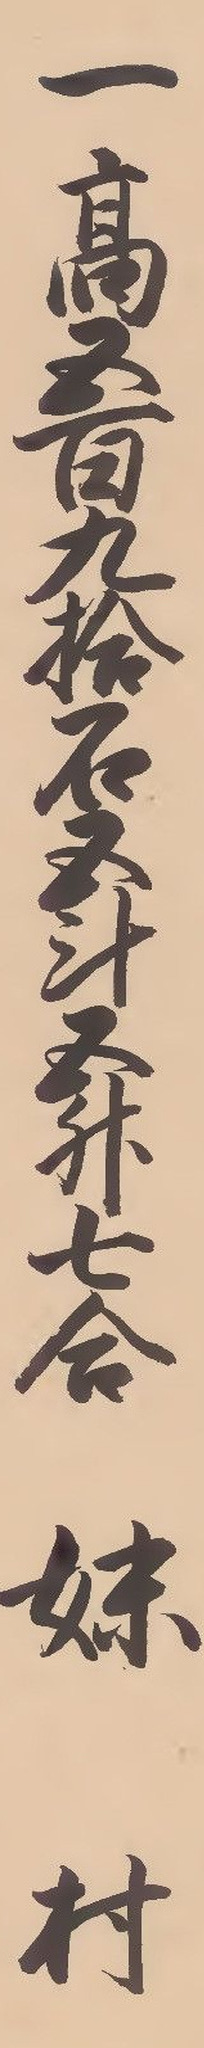一高五百九拾石五斗五升七合妹村
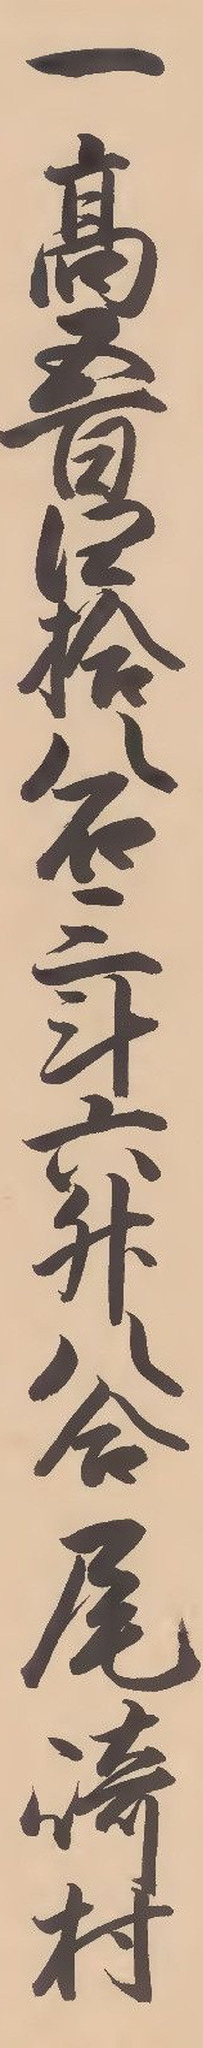一高五百四拾八石三斗六升八合尾崎村
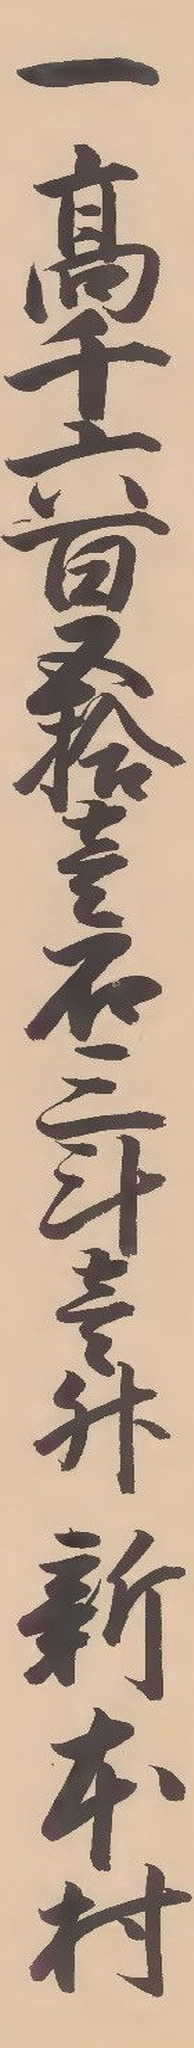一高千六百五拾壱石三斗壱升新本村
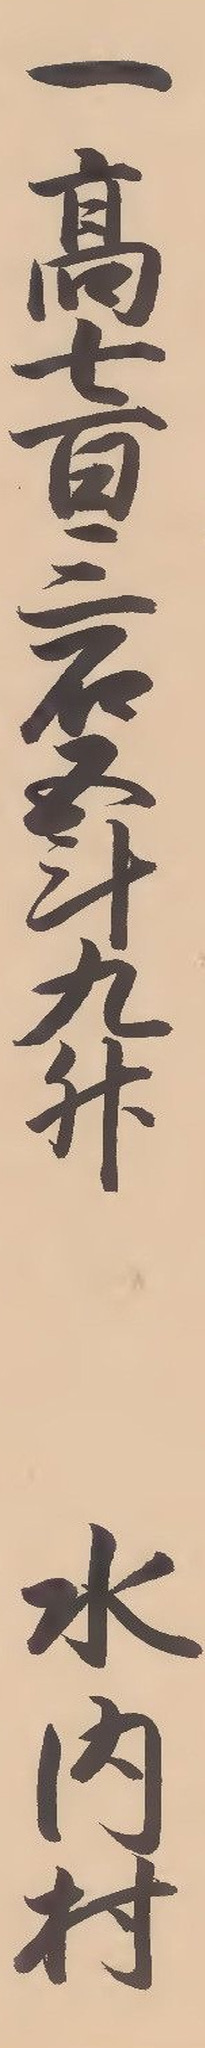一高七百三石五斗九升水内村
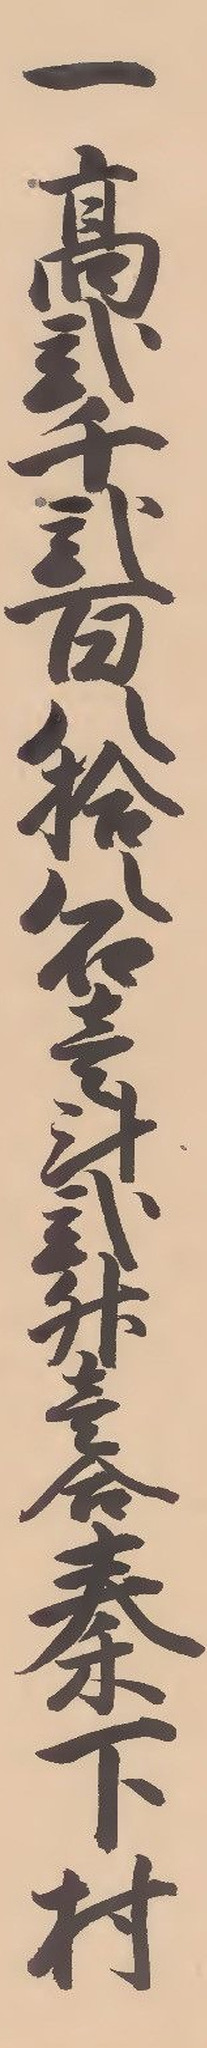一高弐千弐百八拾八石壱斗弐升壱合秦下村
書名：備中国郷帳
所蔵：国立公文書館 National Archives of Japan
